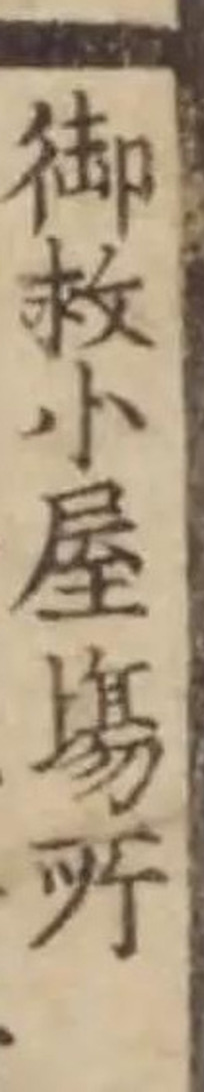御救小屋場所
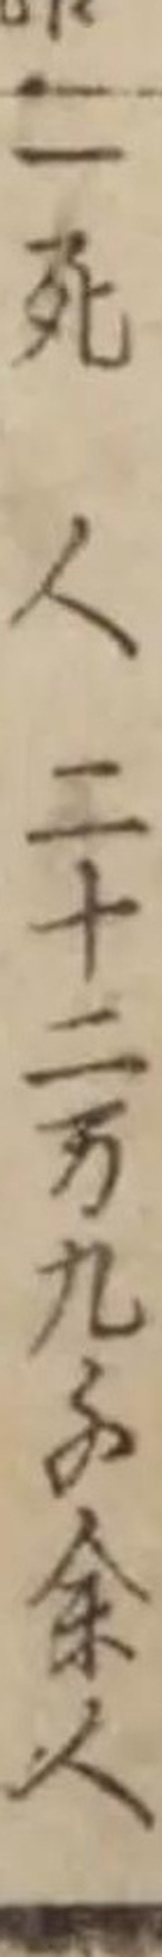一死人二十二万九千余人
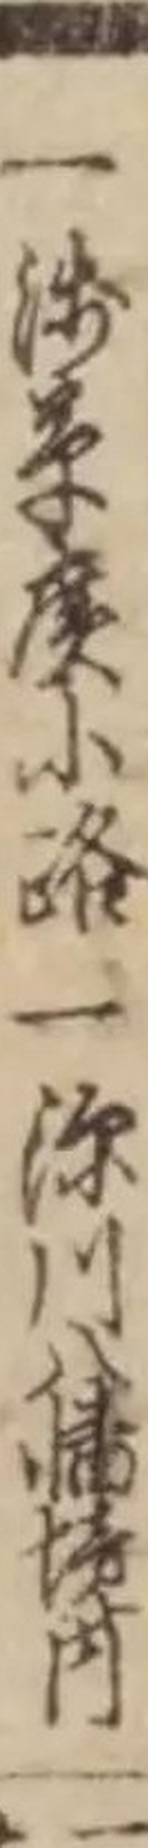一浅草広小路一深川八幡境内
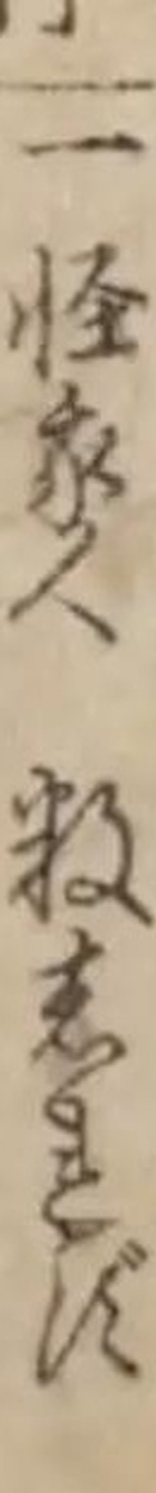一怪家人数しれず
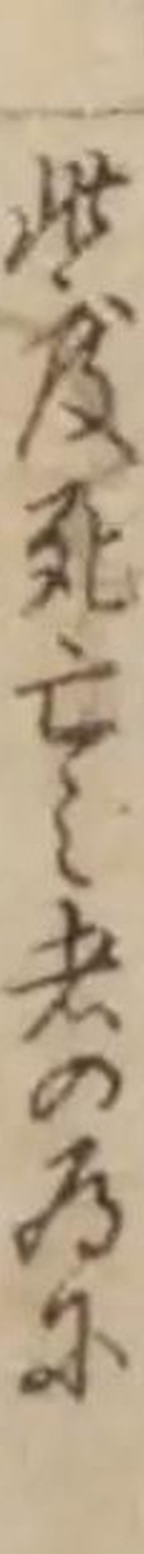此度死亡之者の為に
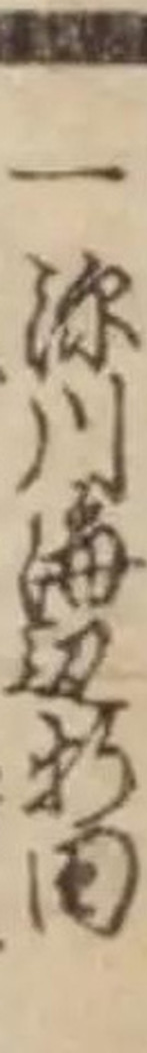一深川海辺新田
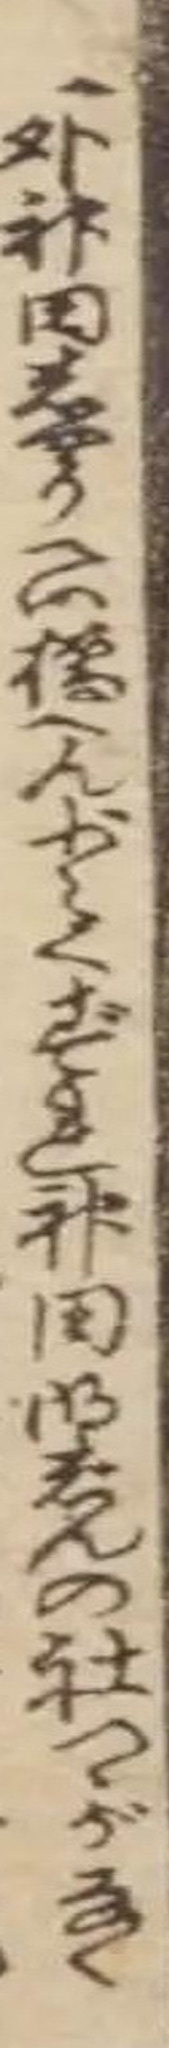外神田しやうへい橋へん少〃くずれ神田明神の社つつがなく
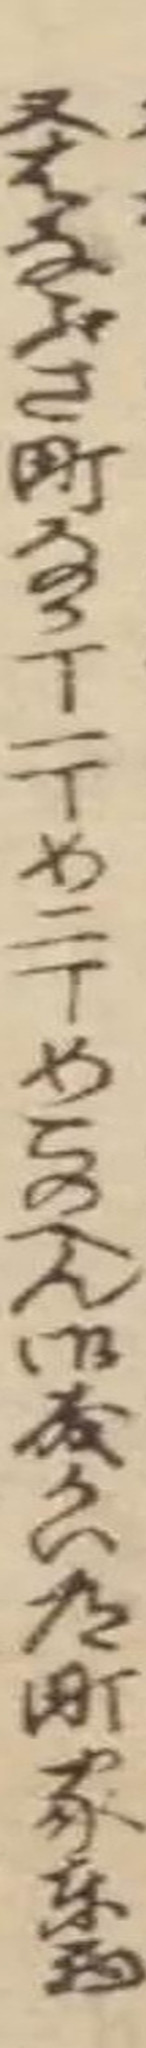又はなぶさ町なか丁一丁め二丁めこのへん御成かい道町家東西
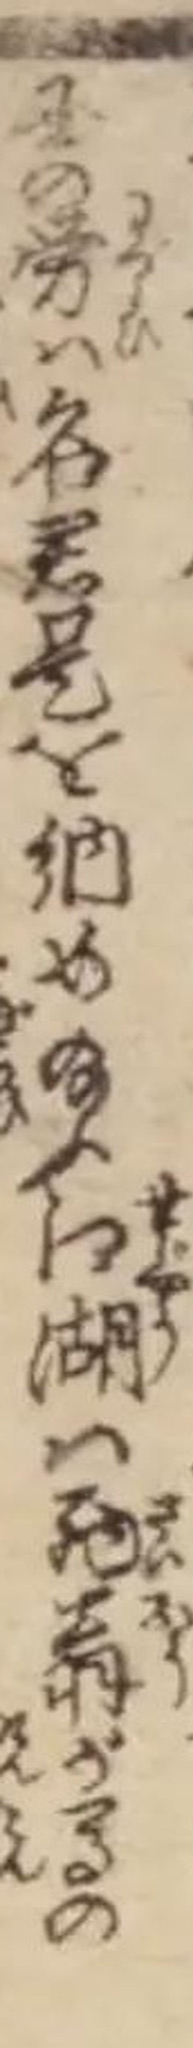国の労は名君是を納め給ふ江湖は西翁が馬の
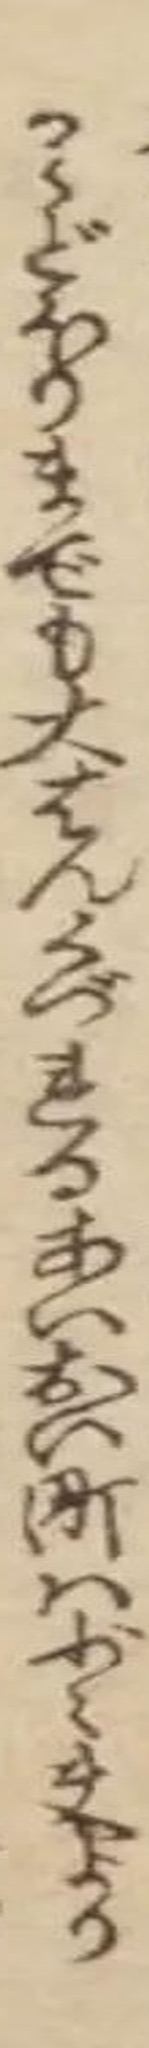からどほりまでも大はんくづれるあいおい町は少〃夫より
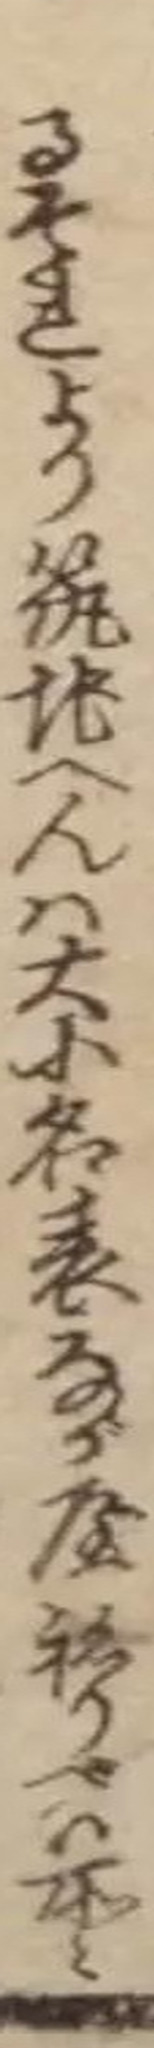るそれより築地へんは大小名表なが屋ねりべい所々
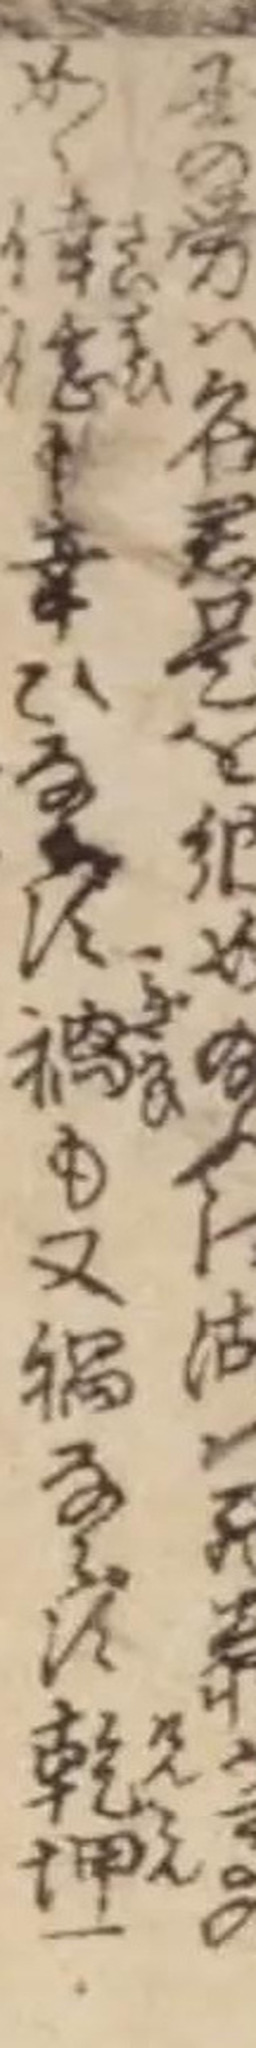如く倖甚も幸ひならず禍も又禍ならず乾坤一
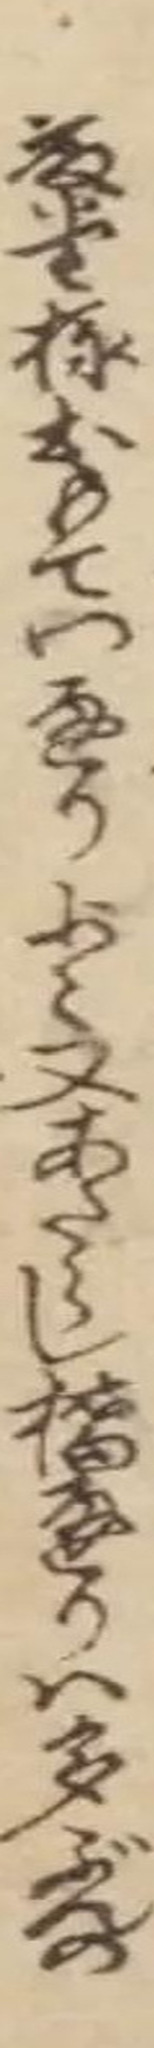藤堂様おもて門通り少〃又あたらし橋通りは多ぶんの
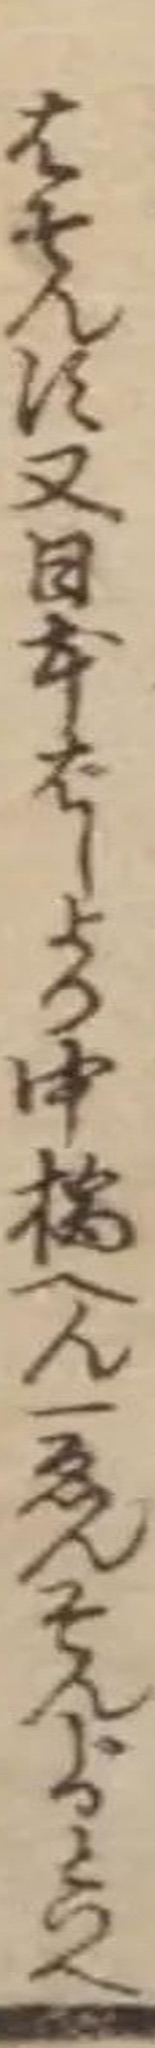はそんす又日本ばしより中橋へん一ゑんそんじるといへ
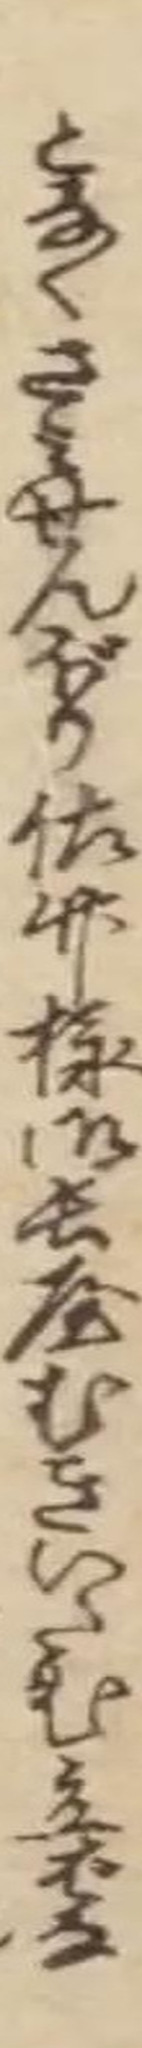となくさみせんぼり佐竹様御長屋むきいたむ立ばな
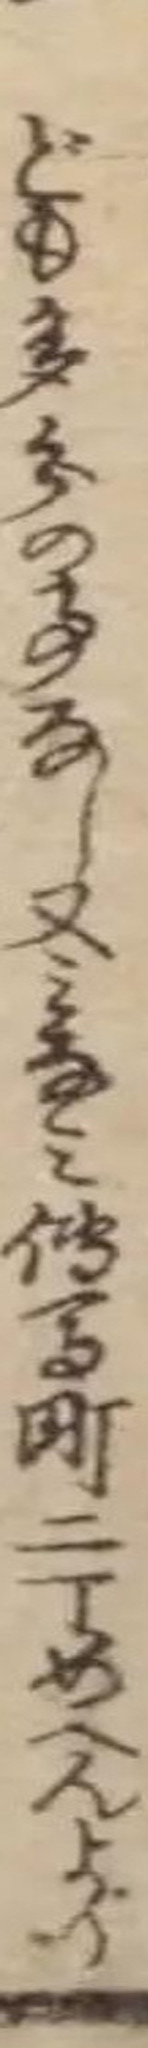ども多分の事なし又みなみ伝馬町二丁目へんより
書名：関東大地震末代鑑
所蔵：国立国会図書館 National Diet Library, JAPAN
